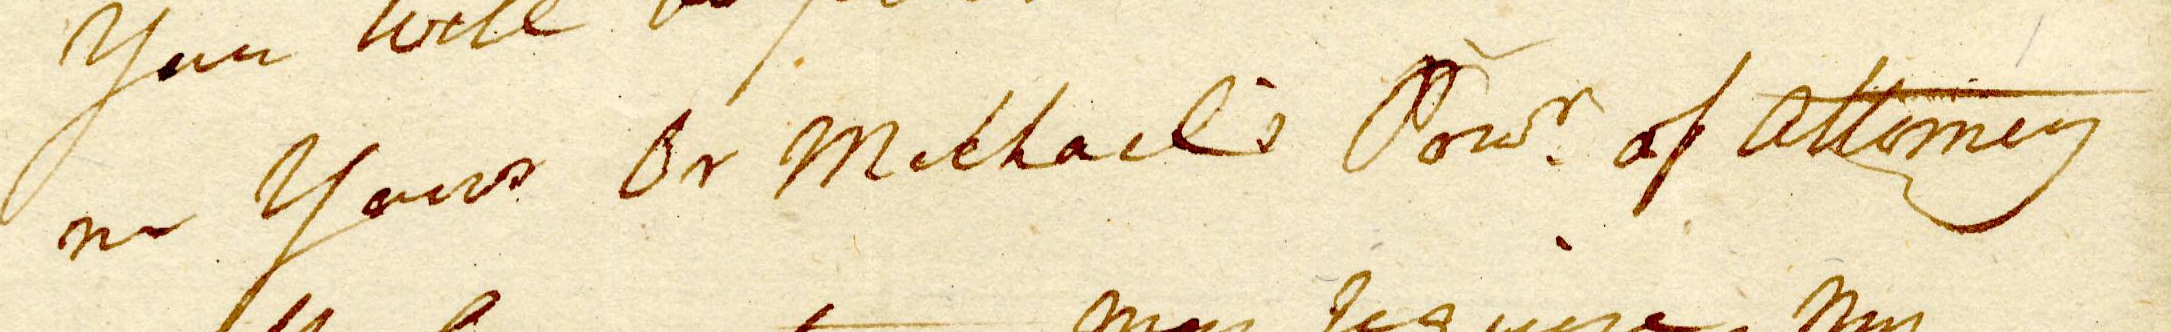me yours Or Michaels Pow^r. of attorney
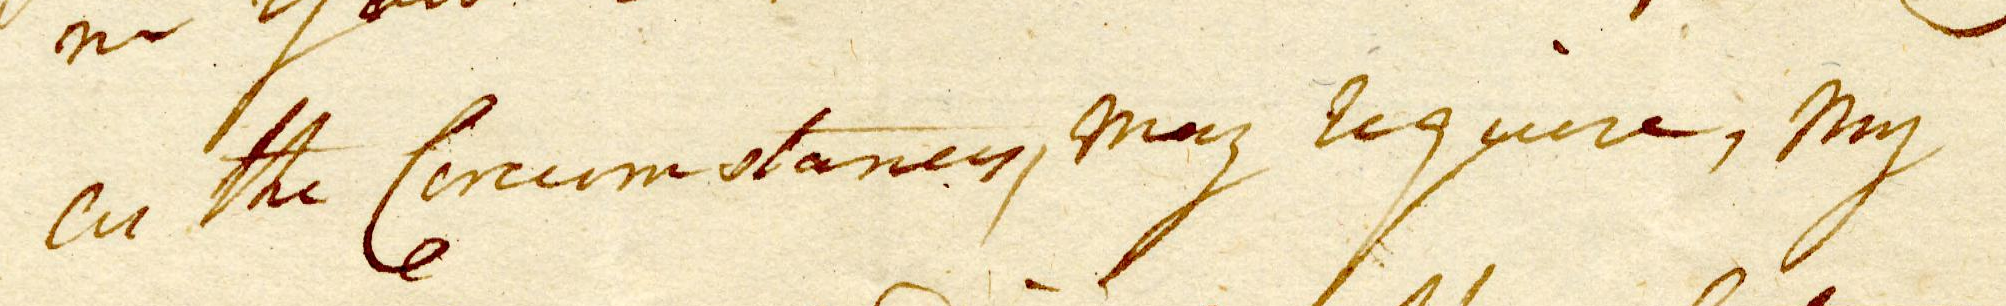cus the circumstances, may require, my
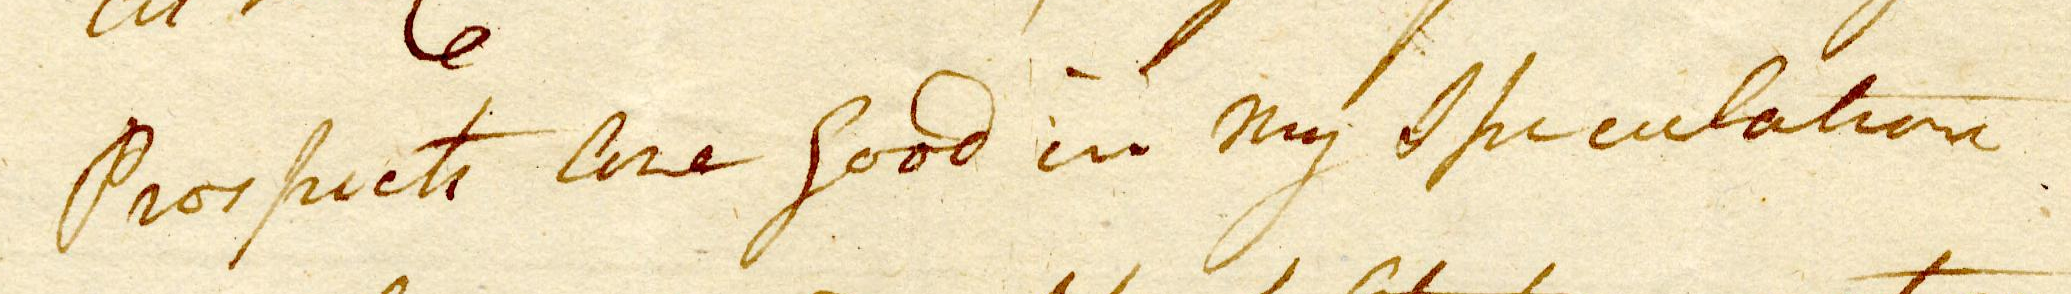prospects are good in my speculation
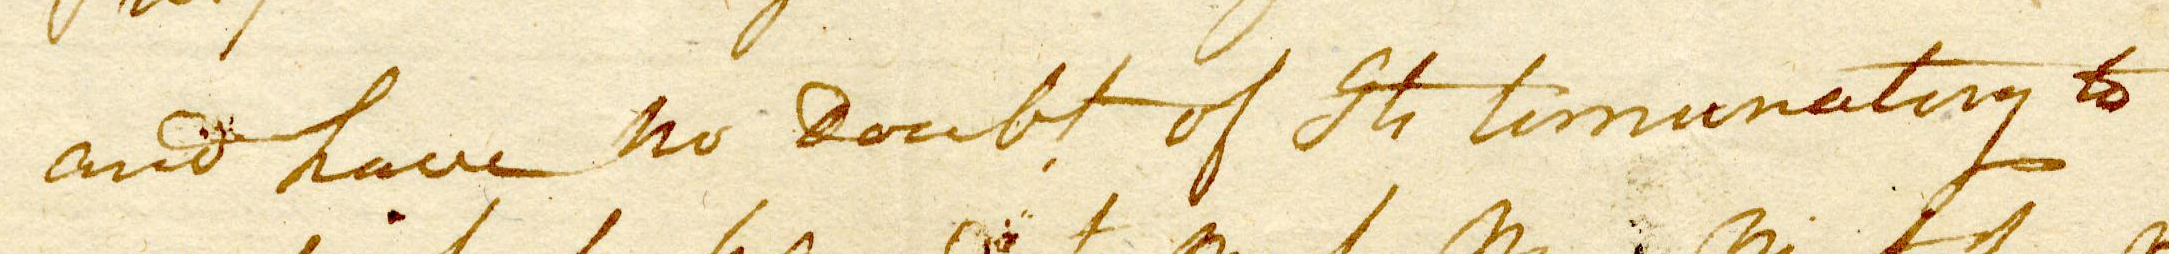and have no doubt of It timunating to
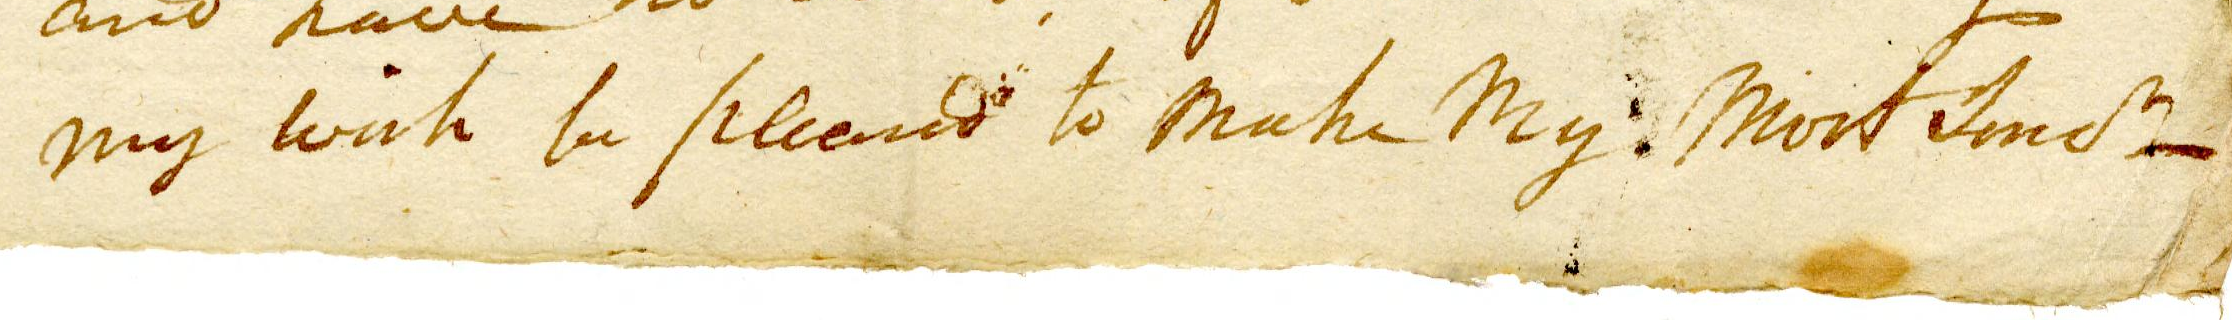my wish be pleased to make my Most send-
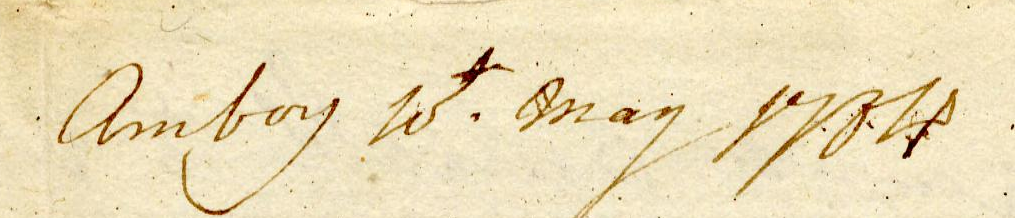Amboy 10^t. May 1784
